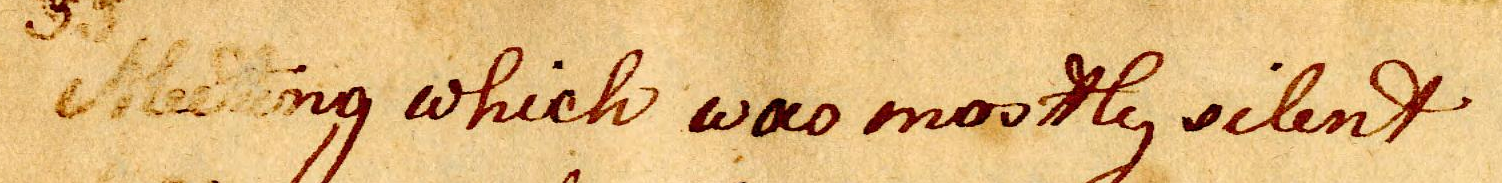Meeting which was mostly silent
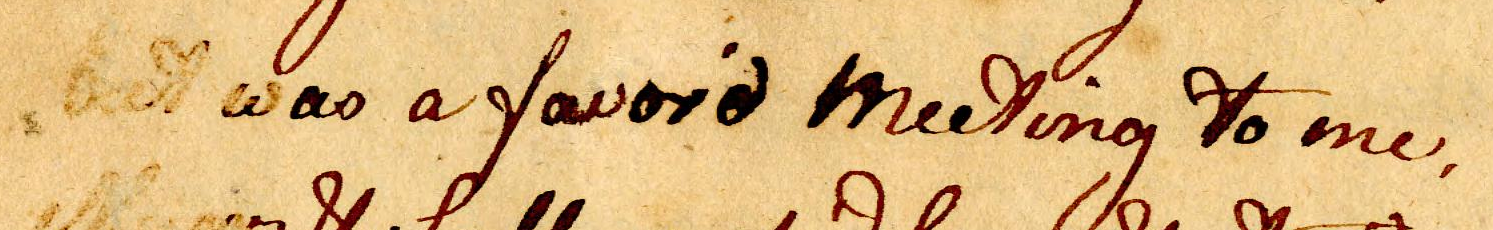but was a favor'd Meeting to me,
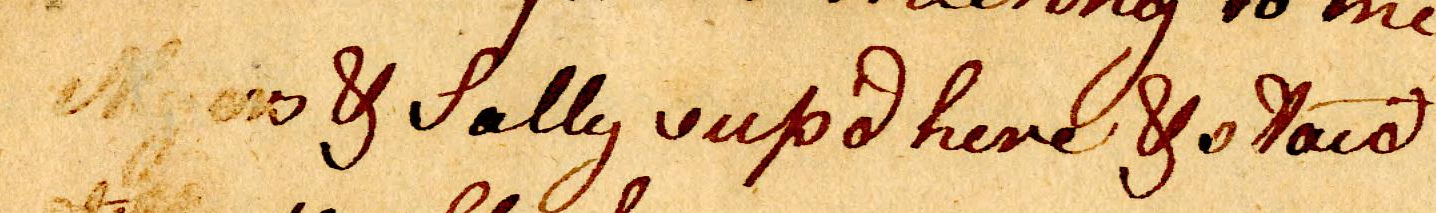Myers & Sally sup'd here & staid
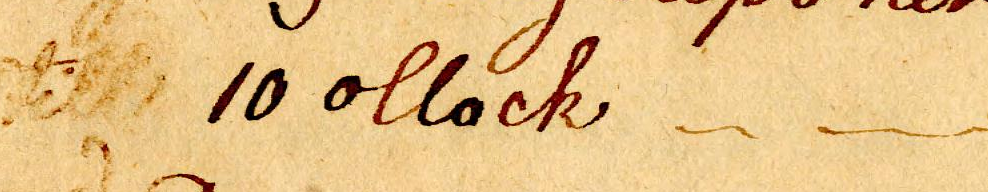till 10 oClock-
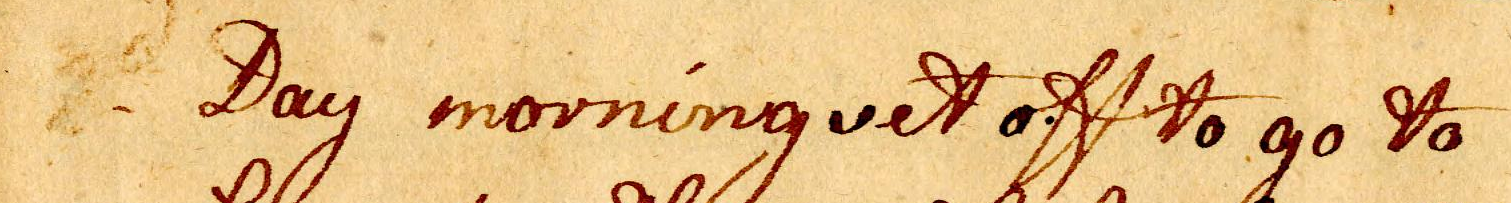2^d Day morning set off to go to
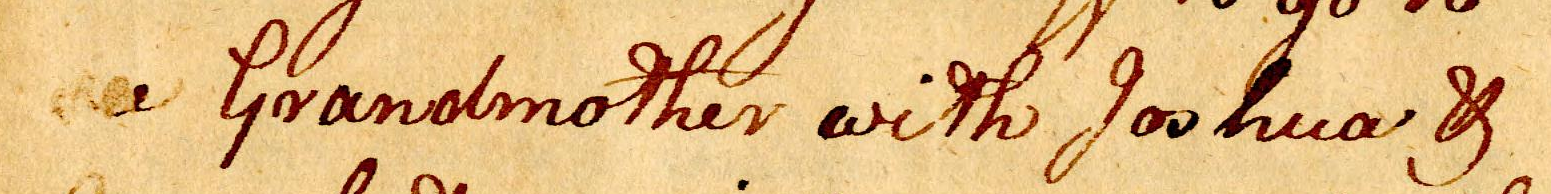see Grandmother with Joshua &
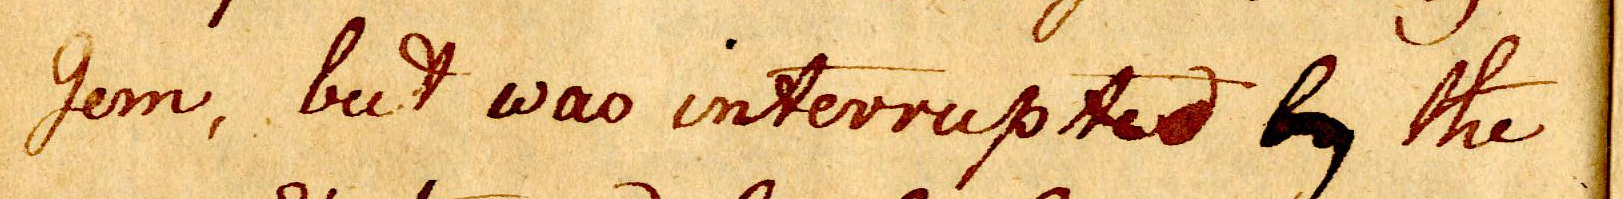Jem, but was interrupted by the
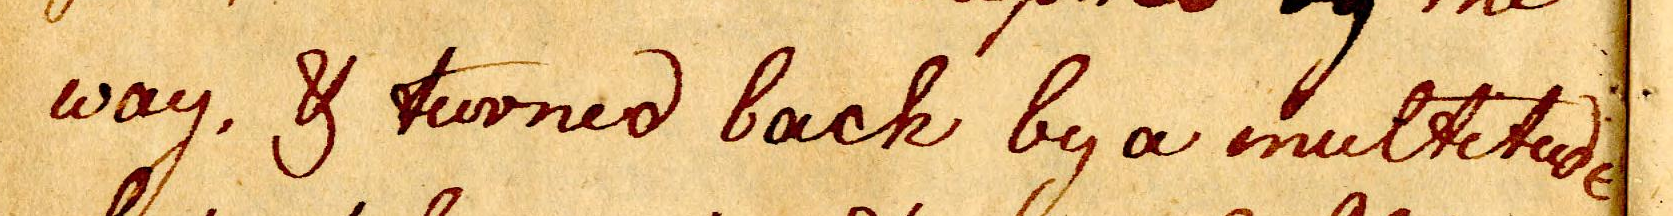way, & turned back by a multitude
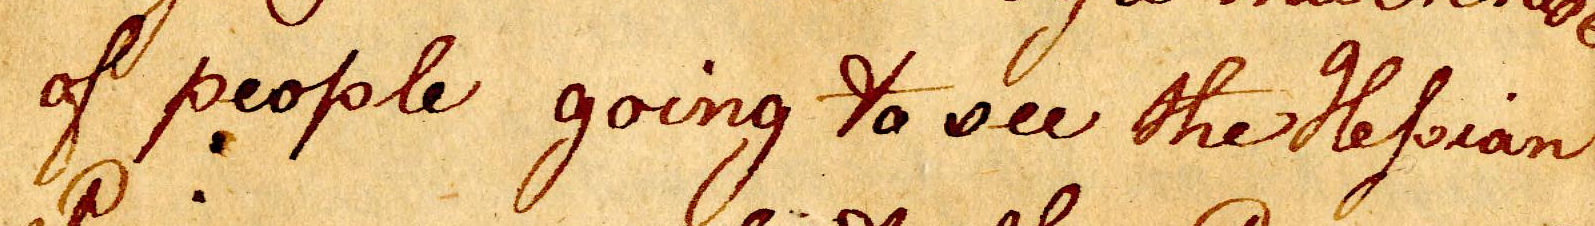of people going to see the Hessian
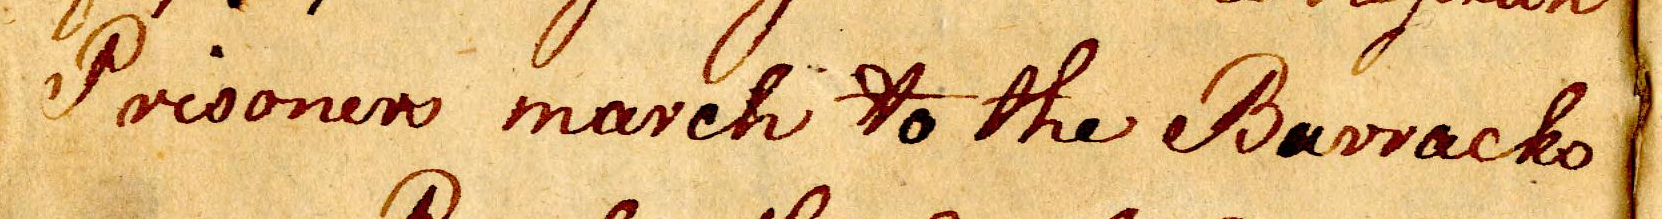Prisoners march to the Barracks
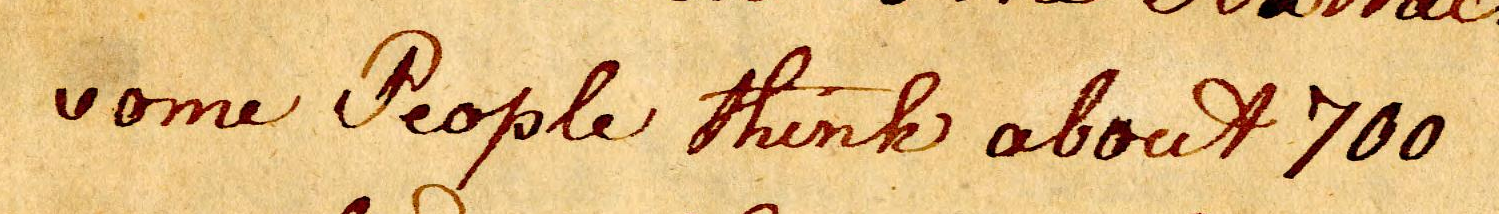some People think about 700
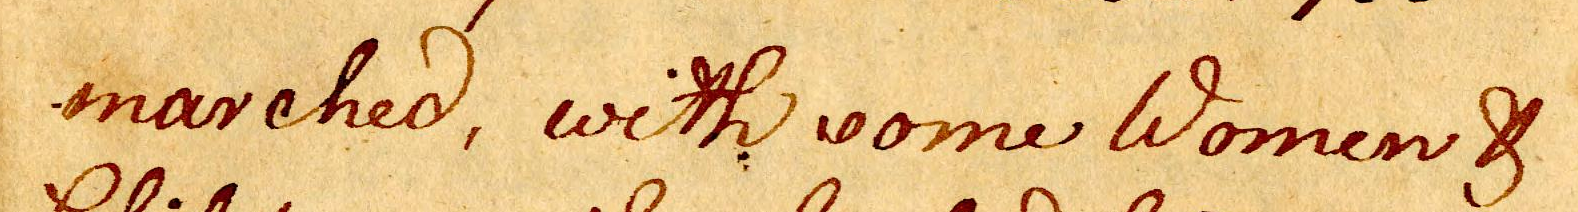marched, with some Women &
